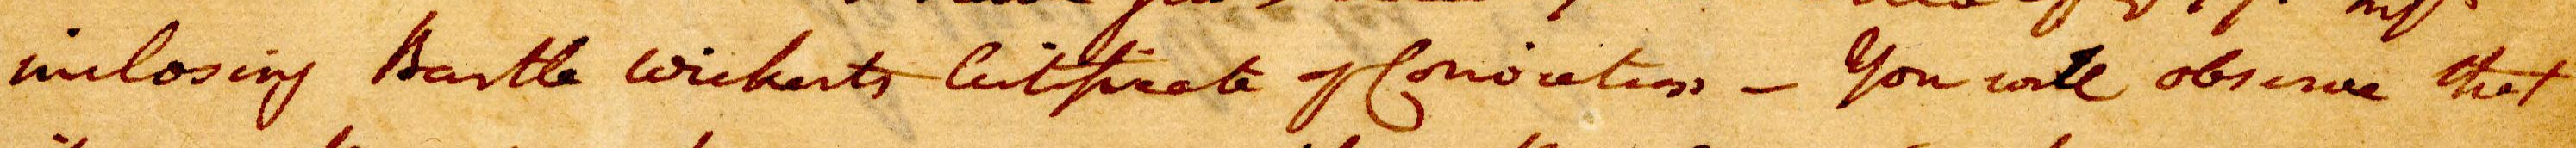inclosing Bartle Wickerts Certificate of Conviction. You will observe that
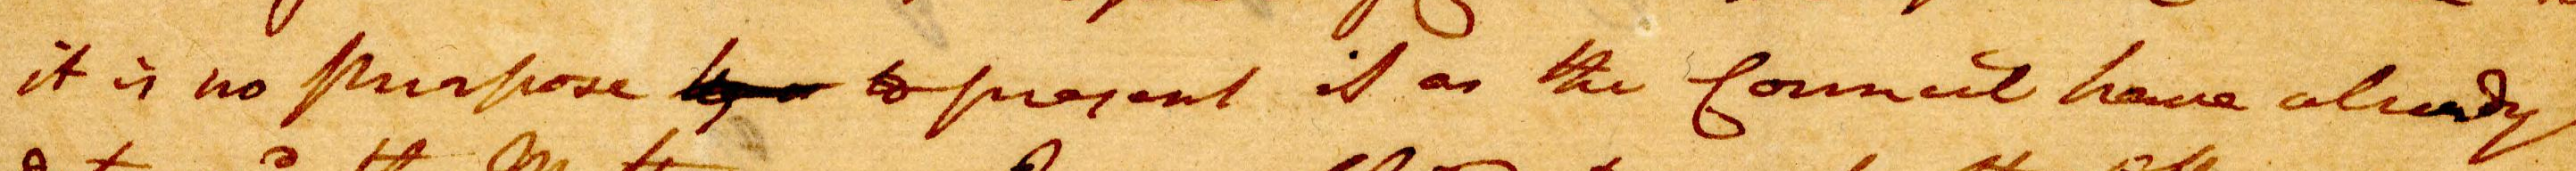it is no purpose [___] to present it as the Council have already
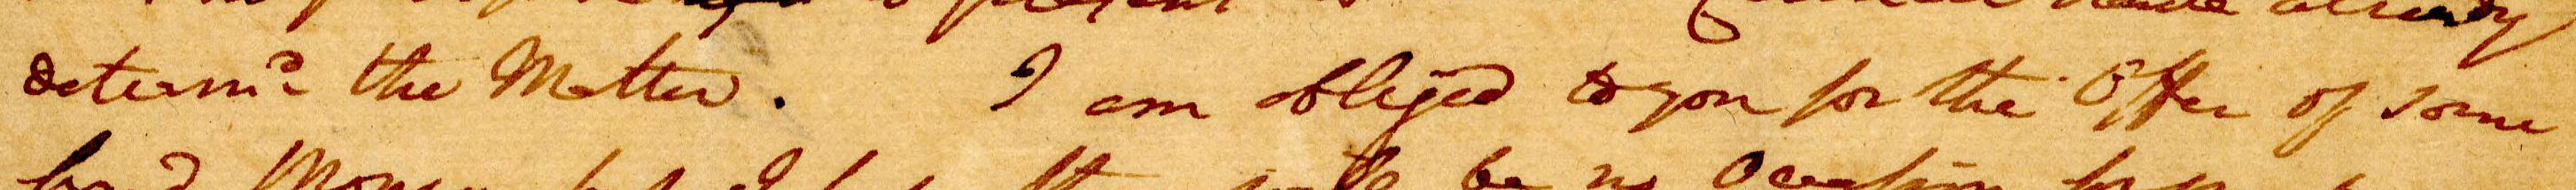determ^d. the Matter. I am obliged to you for the Offer of some
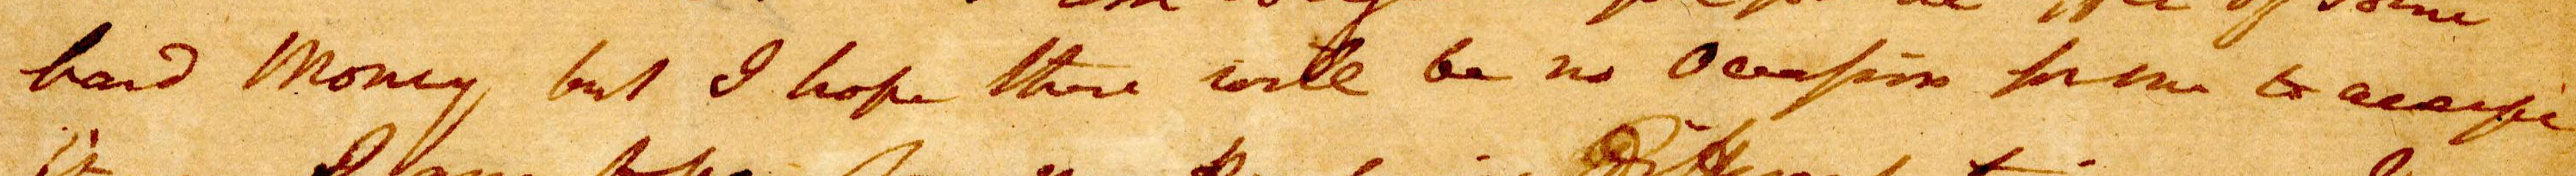hard Money but I hope there will be no Occasion for me to acope
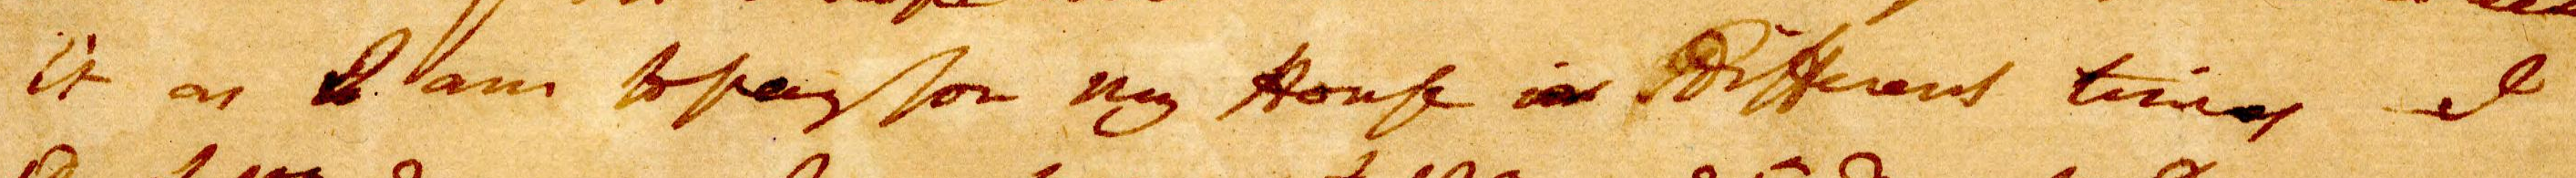it as I am to pay for my House in different times. I
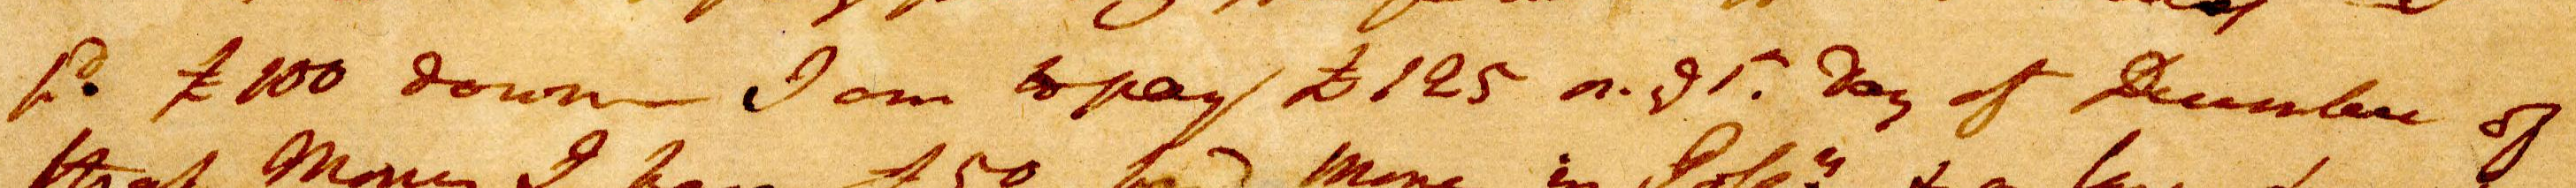b^d. £100 down. I am to pay £125 on 21^t day of December of
